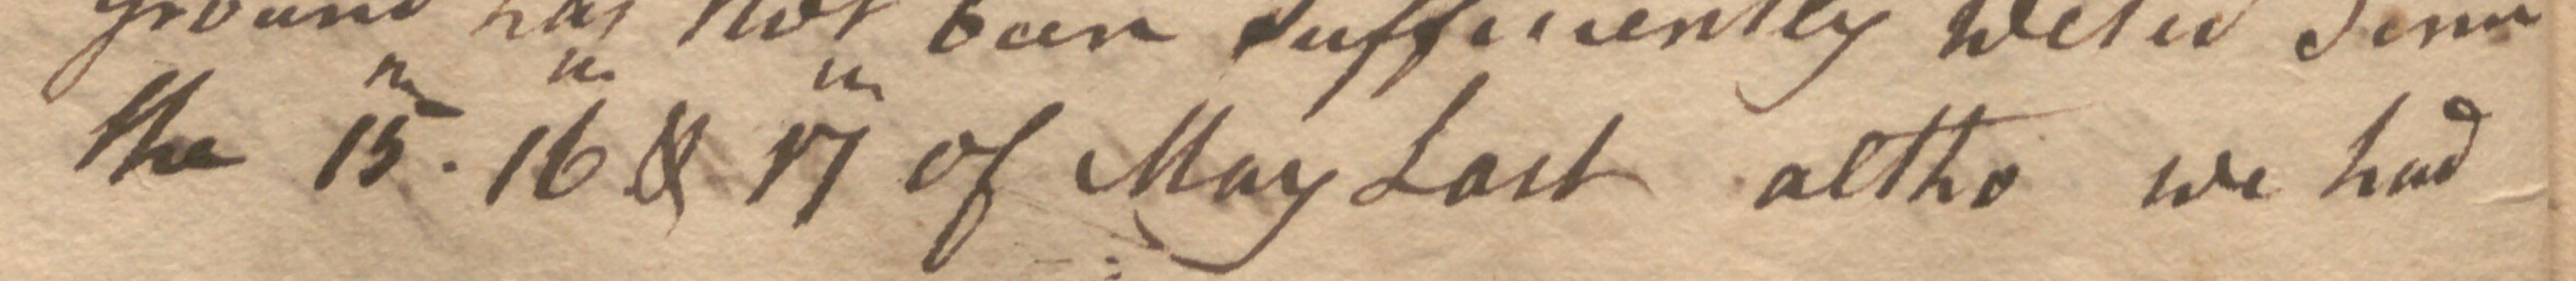the 15^th. 16^th & 17^th of May Last altho we had
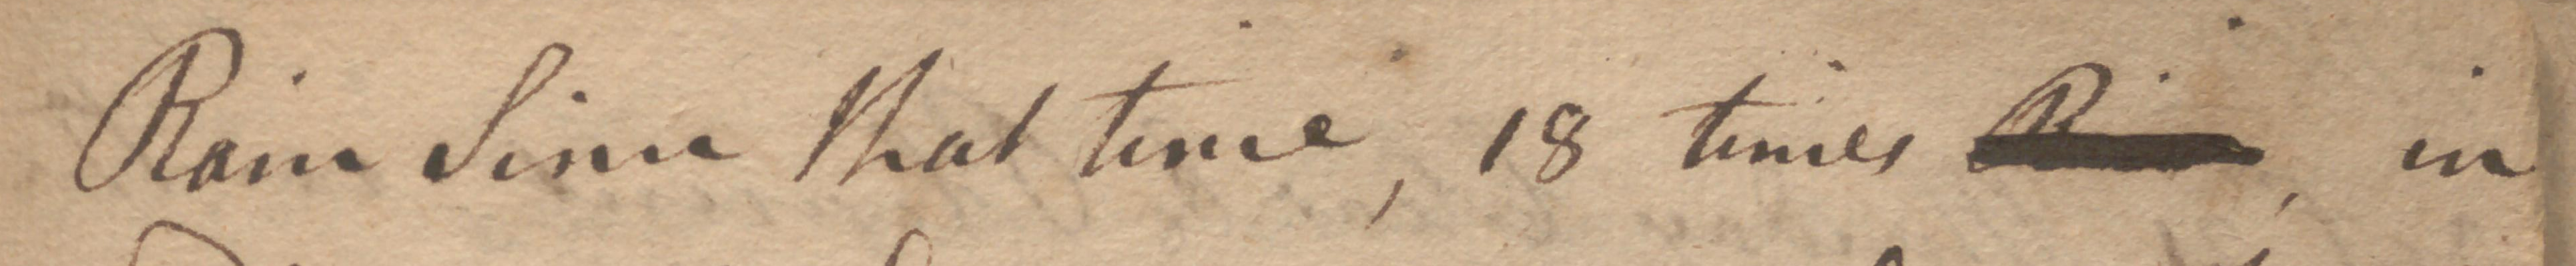Rain since that time 18 times [Rain] in
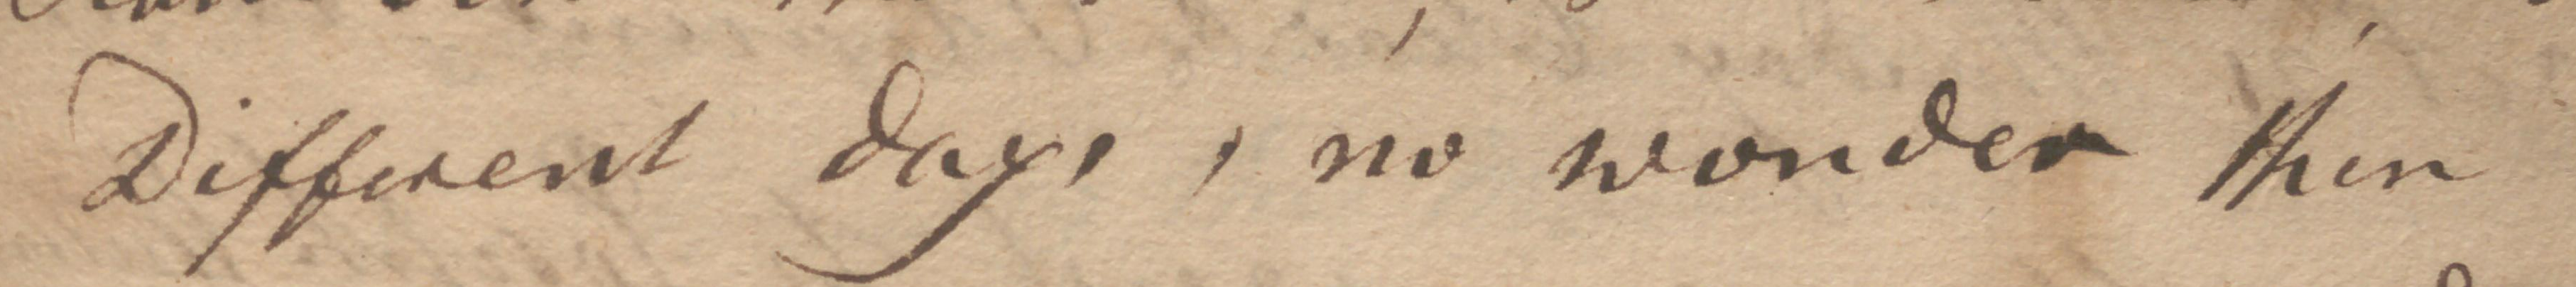Different days, no wonder then
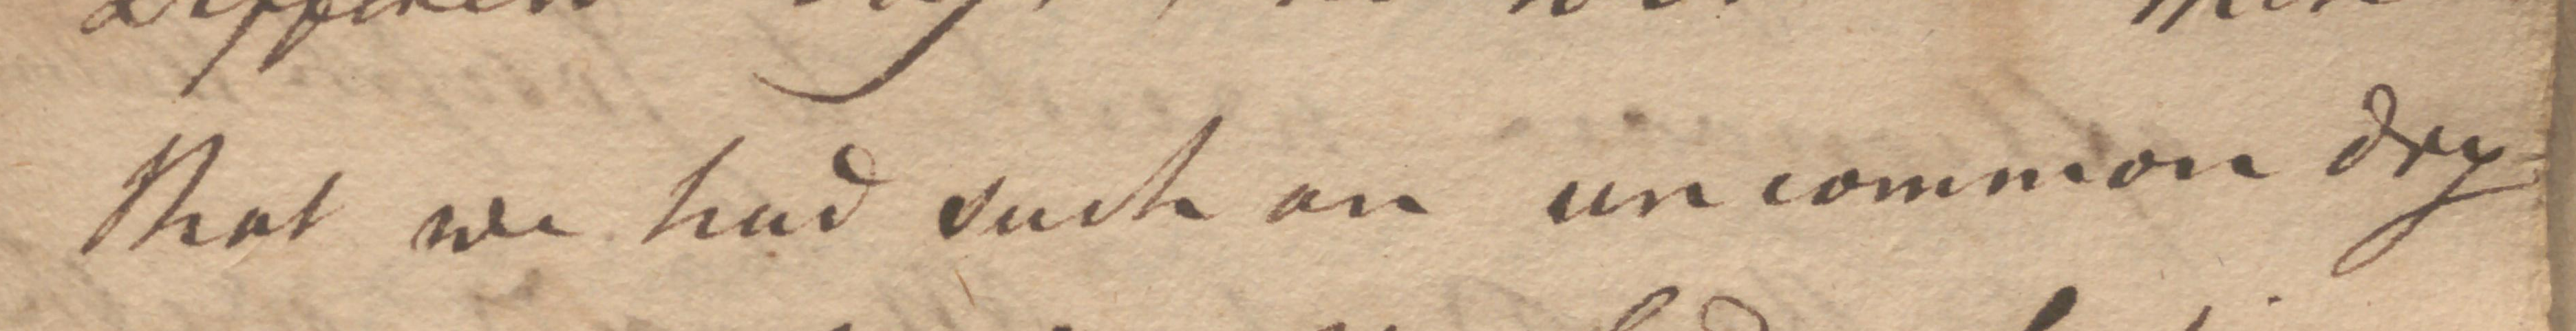that we had such an un common dry
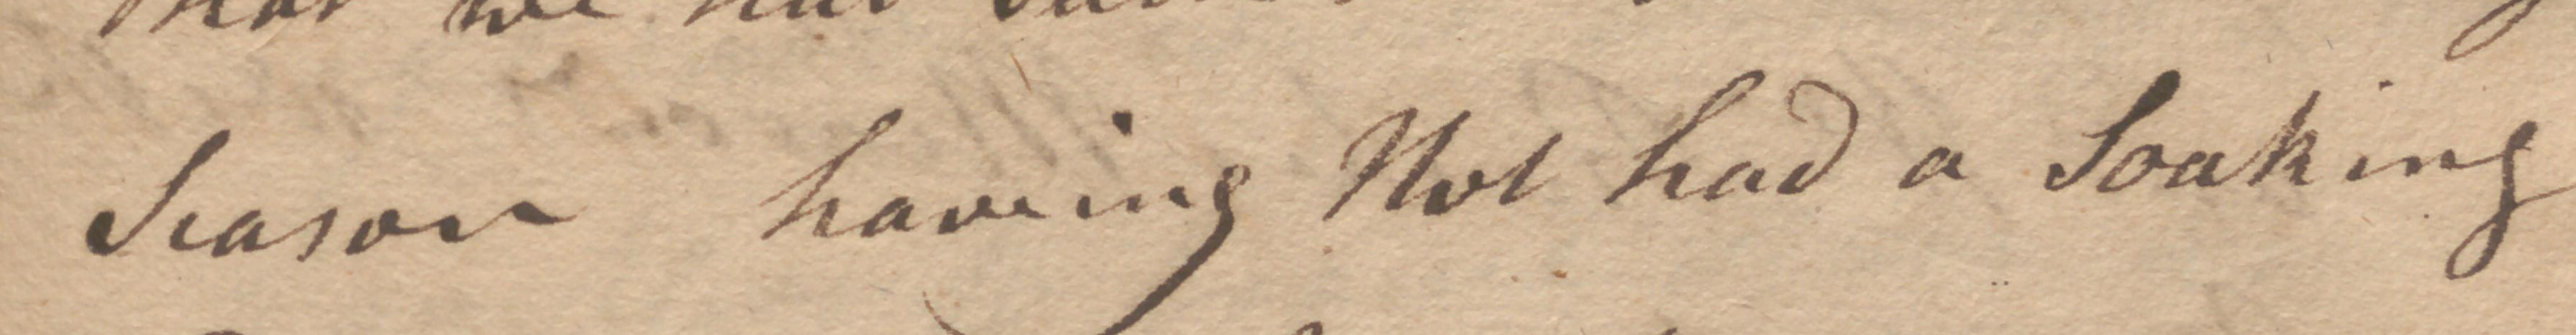Season haveing Not had a Soaking
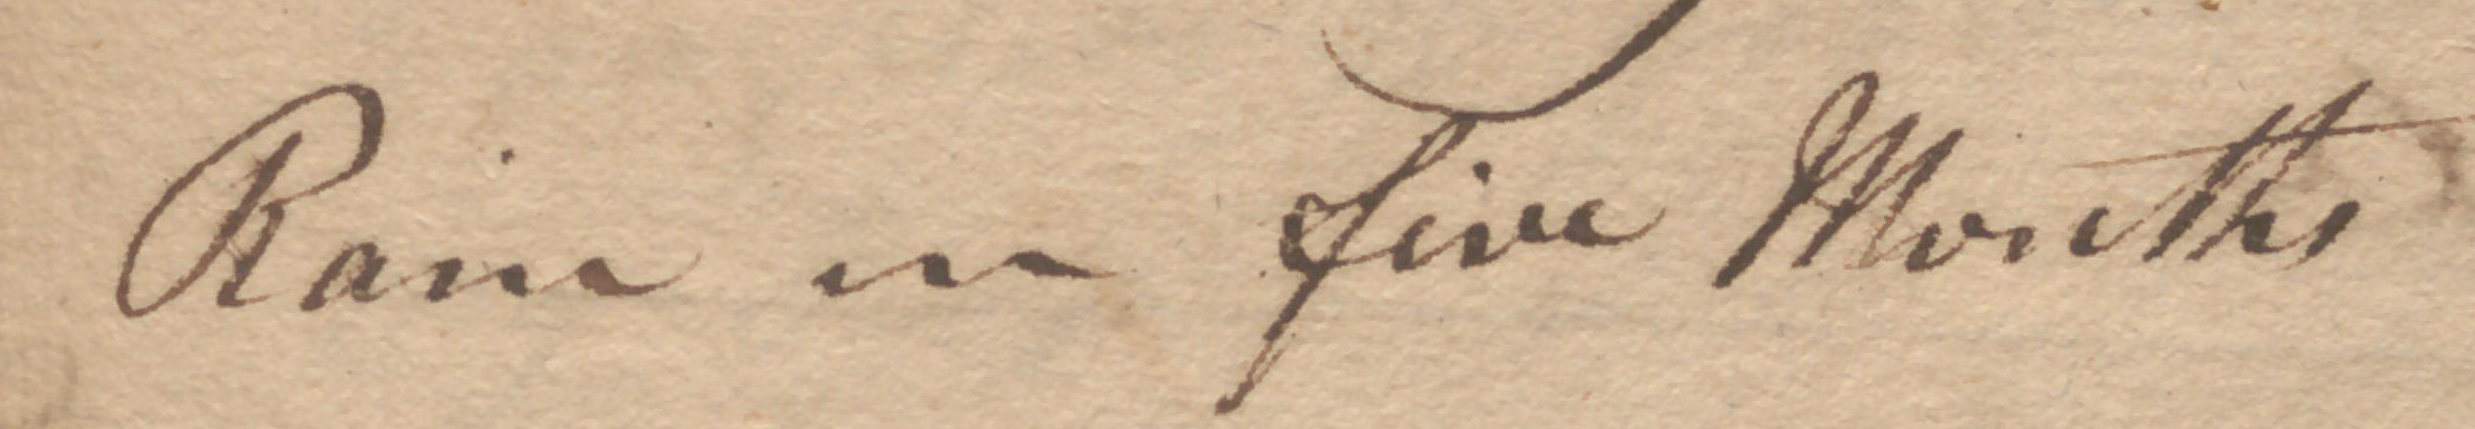Rain in five Months
